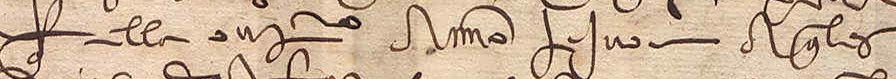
q̄ ella outro Ann̄o JeJuou Aq̄les
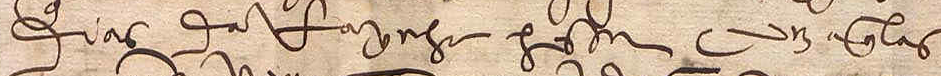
dias da Raynha hester Com aq̄las
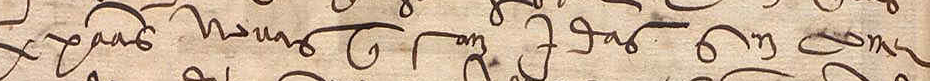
xpāas nouas q̄ sam Jdas sem comer
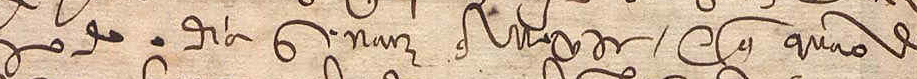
todo o dia senam A noyte / E q̄ quãodo
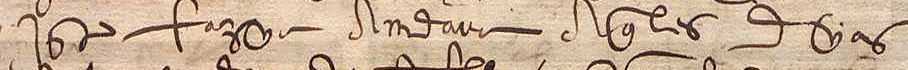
Jsto fazya Amdaua Aq̄les dyas
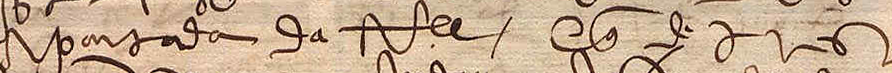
Apartada da ffee / e q̄ de tres
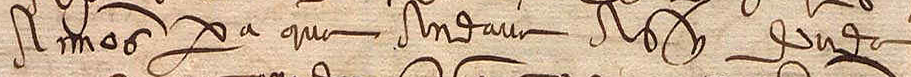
Ann̄os ꝑa qua Andaua Asy douda
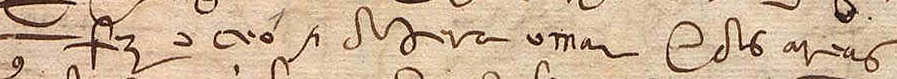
q̄ fez o çeo e A tera o mar e As areas
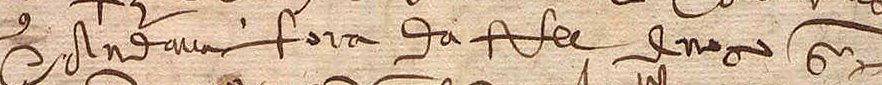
e Andaua fora da ffee de noso s̄or
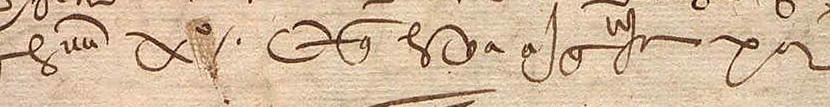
Jhūu Xo /. E q̄ hya a JgrJa por
